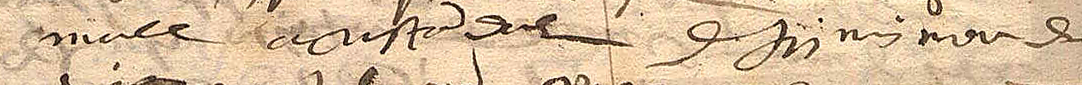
mall a cristādade detriminou de
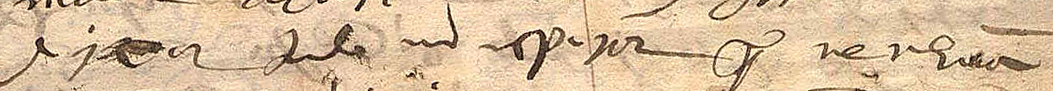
dejxar todo nē esperar p̄o nenhuā
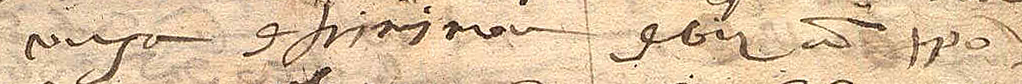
cousa detriminou de vir cō tpō
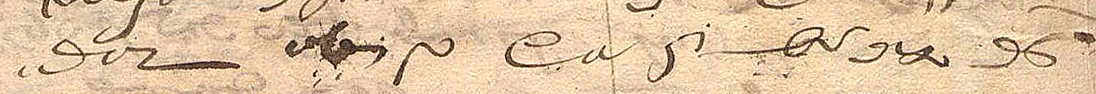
a dar aviso e asi bēdito ds̄
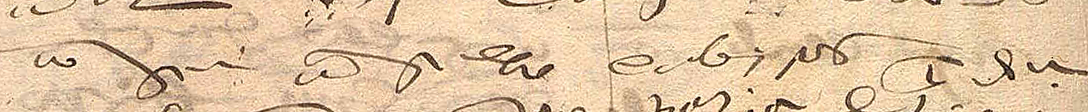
c̄o seu cōselho e avjsos q̄ deu
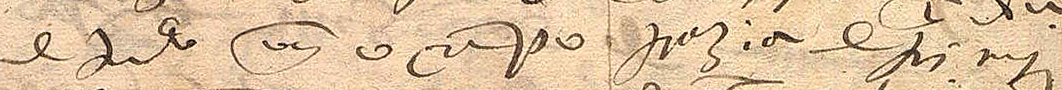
de tudo o q̄ o cāpo trazia detrimj
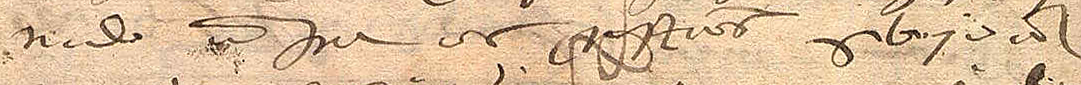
nado cōtra os cristaõs se vejo cō
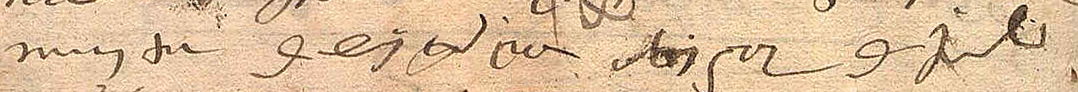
mujta deljgēcia avisar de tudo
